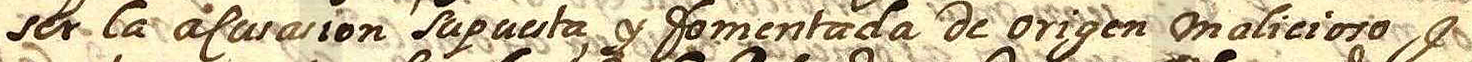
ser la aCusasion supuesta, y fomentada de origen malicioso y
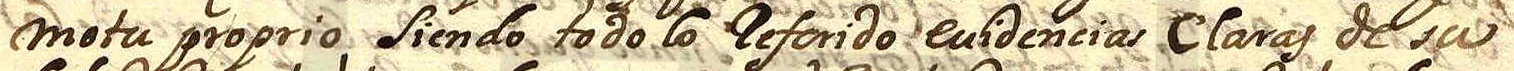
motu proprio, siendo todo lo Referido euidencias Claras de su
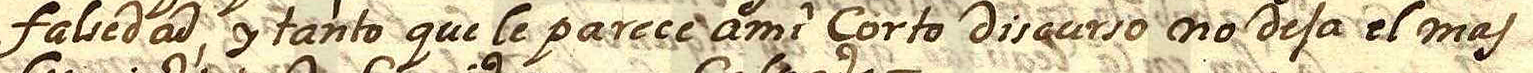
falsedad, y tanto que se parece a mí Corto discurso no deja el mas
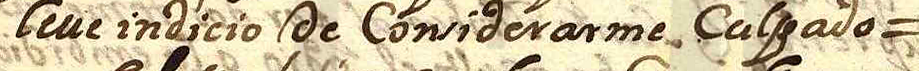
leue indicio de Considerarme Culpado
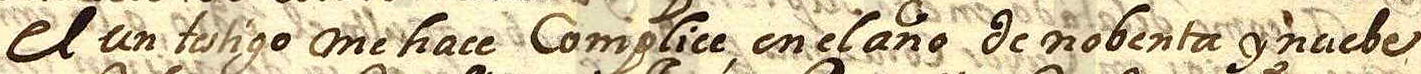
El un testigo me hace Complice, en el año de nobenta y nuebe
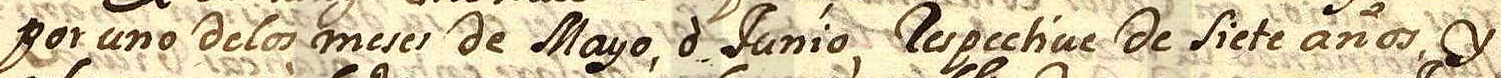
por uno delos meses de Mayo, ò Iunio, Respectiue de siete años, y
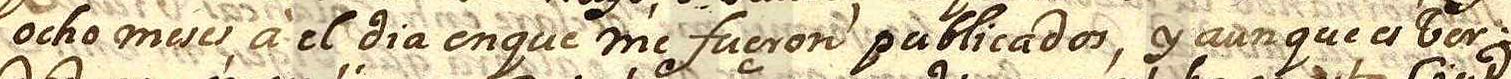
ocho meses, à el dia en que me fueron publicados, y aunque es ver
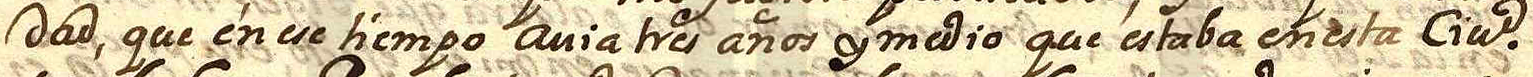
dad, que en ese tiempo auia tres años y medio que estaba en esta Ciud.
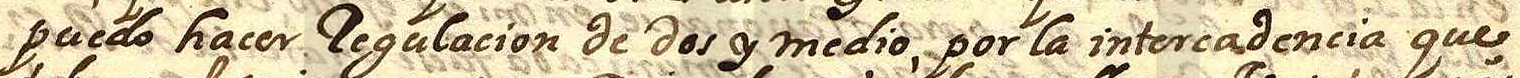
puedo hacer Regulacion de dos y medio, por la intercadencia que
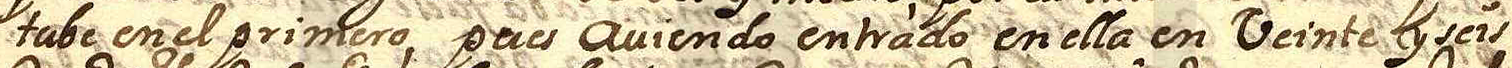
tube en el primero, pues auiendo entrado en ella en Veinte y seis
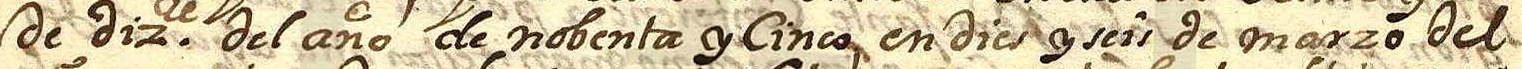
de diz.re del año de nobenta y Cinco, en dies y seis de marzo del
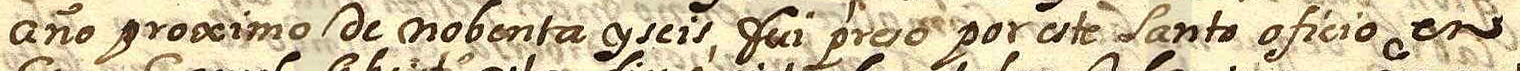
año proximo de nobenta y seis, fui preso por este santo oficio en
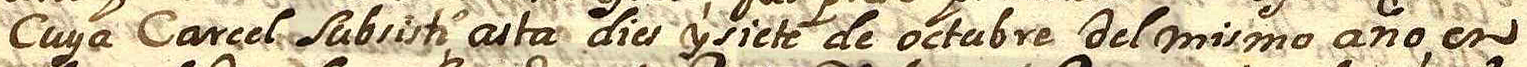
Cuya Carcel subsisti, asta dies y siete de octubre del mismo año en
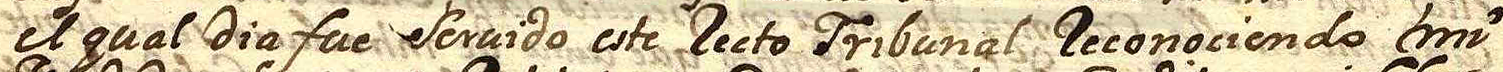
el qual dia fue seruido este Recto Tribunal Reconociendo mi
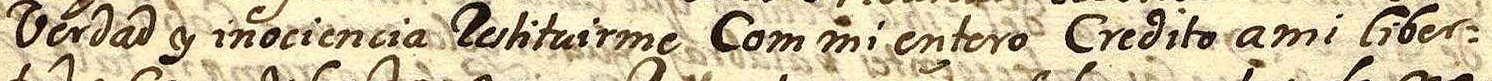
Verdad y inociencia Restituirme Com mi entero Credito a mi liber
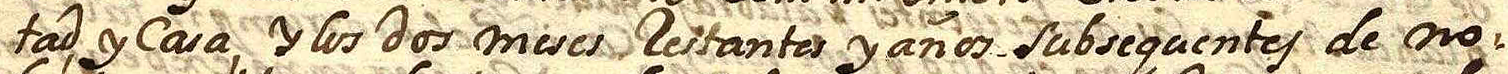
tad, y casa y los dos meses Restantes y años subsequentes de no
